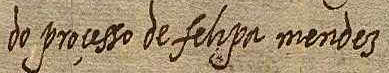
do proçesso de felipa mendez
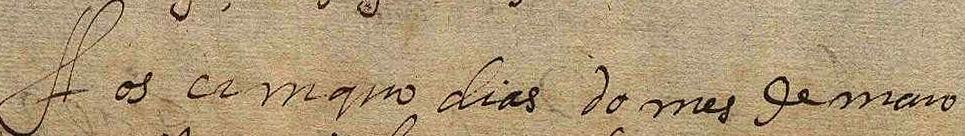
Aos cimquo dias do mes de maio
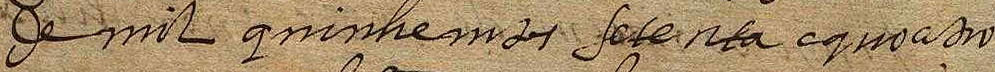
de miL quinhemtos setenta e quoatro
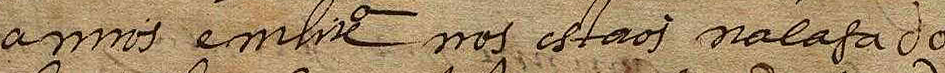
annos em lixa nos estaos na casa do
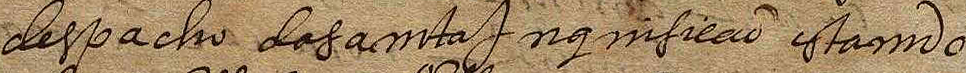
despacho da samta Jnquisicaõ estamdo
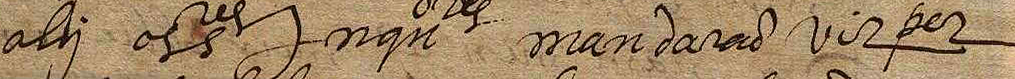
ahj os sres Jnquores mandaraõ vir per
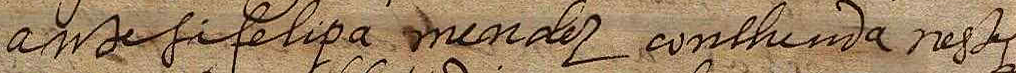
ante si felipa mendez contheuda nestes
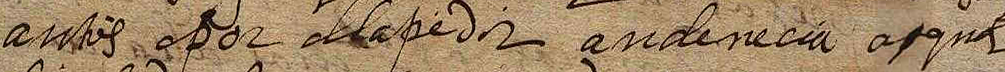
autos por ella pedir audenecia a quaL
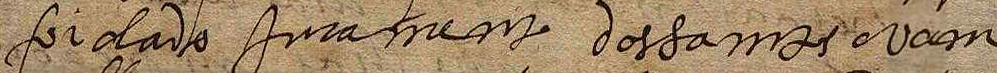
foi dado Juramento dos samtos evam
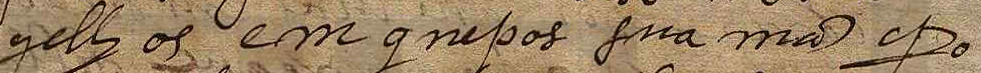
gelhos em que pos sua maõ e ꝓo
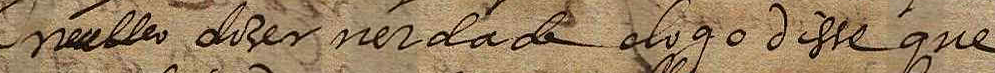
metteo dizer uerdade e logo disse que
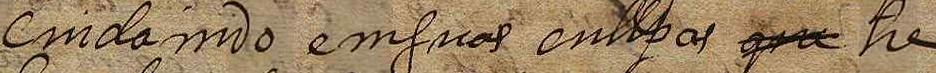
cuidamdo em suas cullpas que he
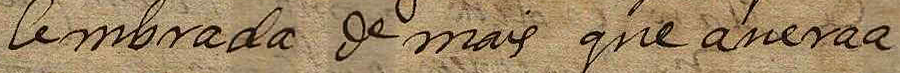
lembrada de mais que aueraa
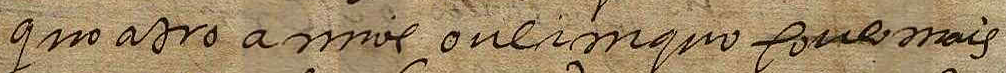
quoatro annos ou cimquo pouco mais
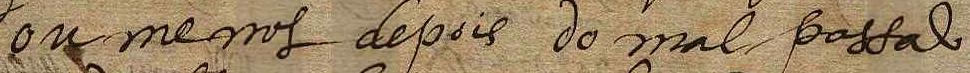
ou menos depois do mal passado
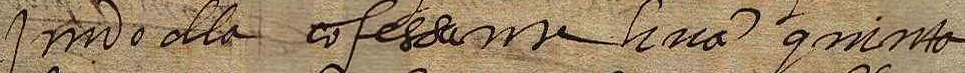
Jmdo ella co̅fessante hua̅ quinta
